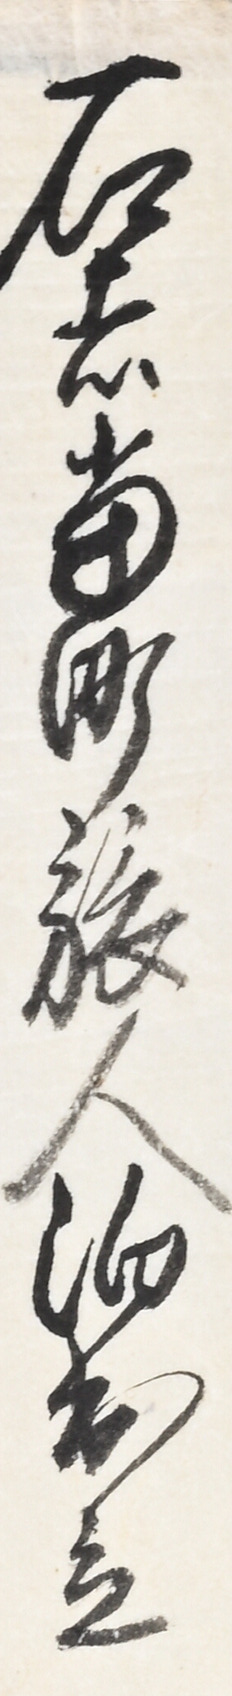右者当町旅人泊出立
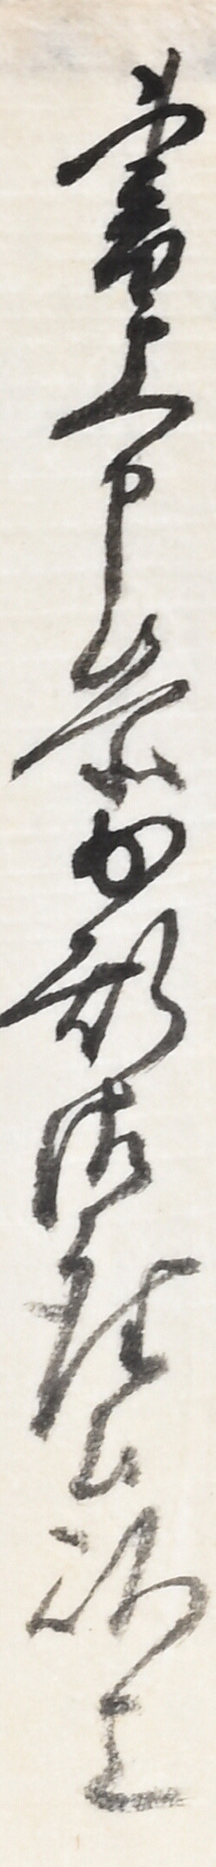書上申候所如斯御座候以上
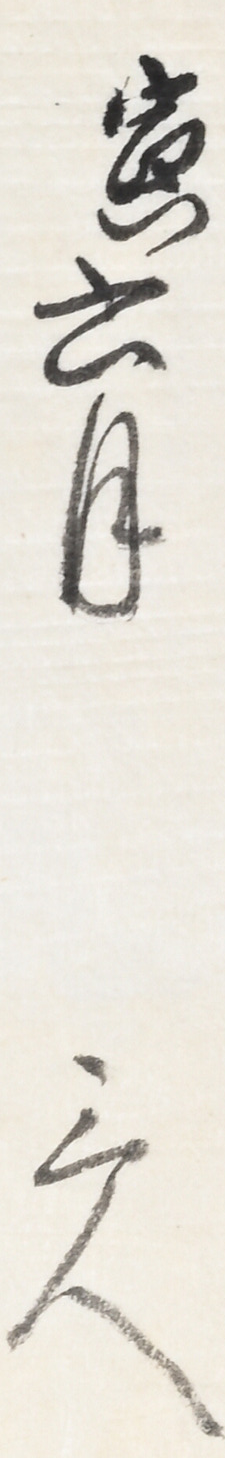寅六月三人

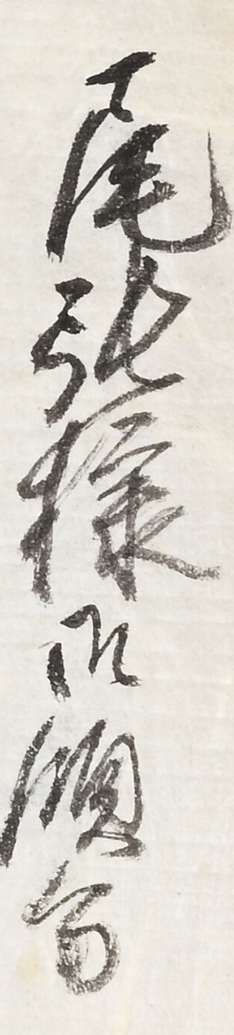尾張様御領分
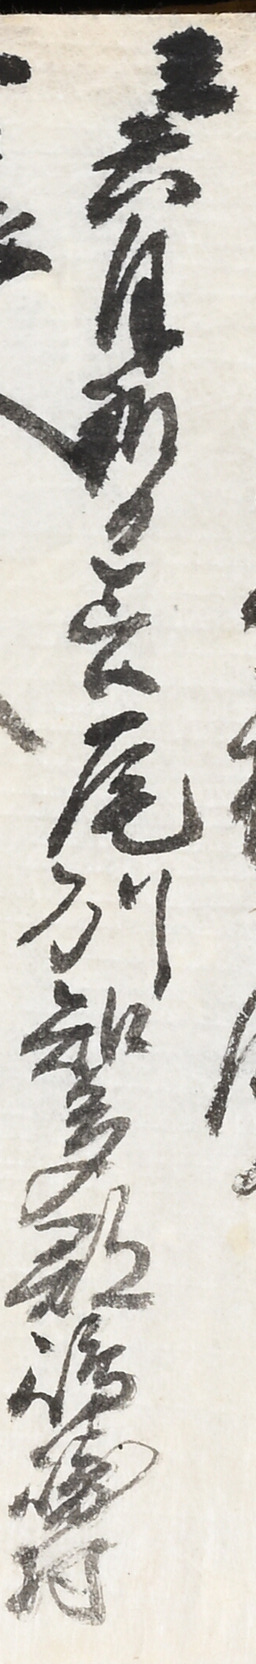壬六月朔日着尾州知多郡嶋崎村
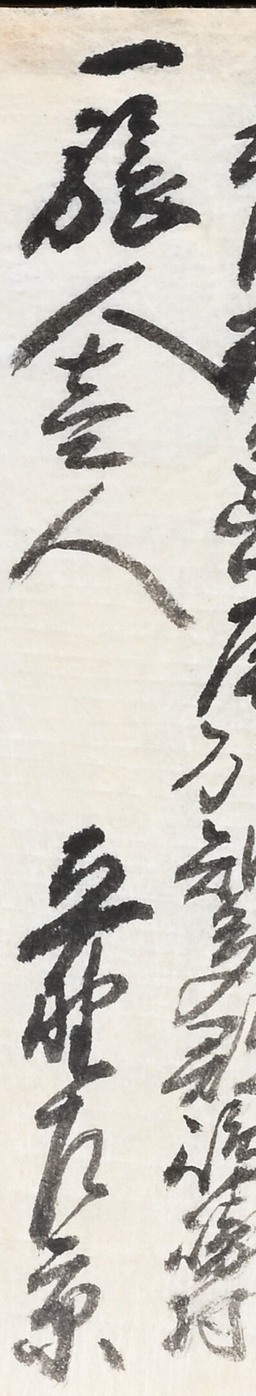一旅人壱人平野左京
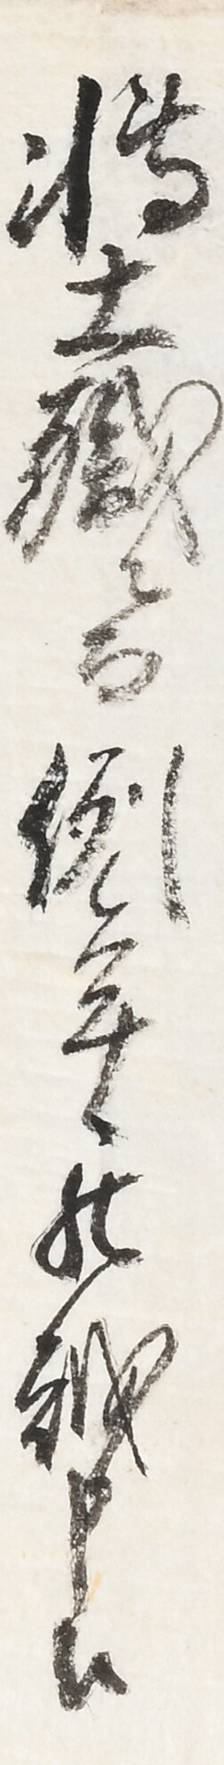転士職ニ而例年罷越申候
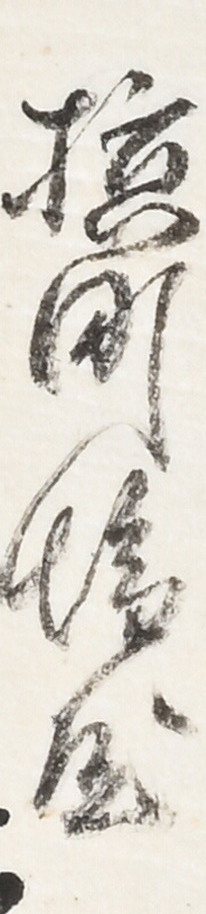横町塩屋
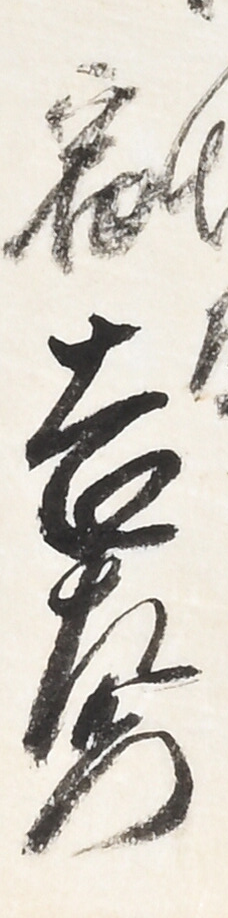宿吉左衛門
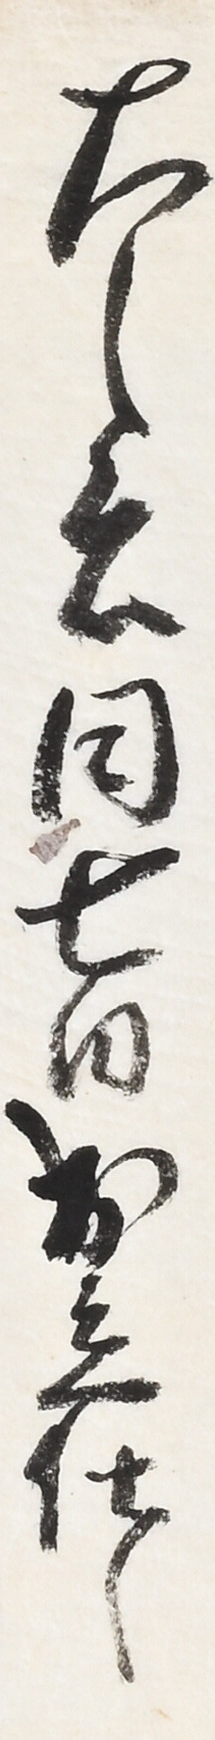右之者同七日出立仕候
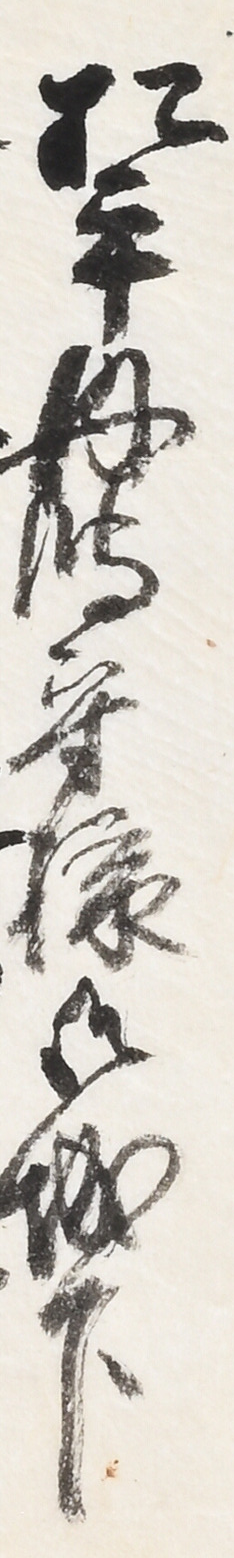松平丹波守様御城下
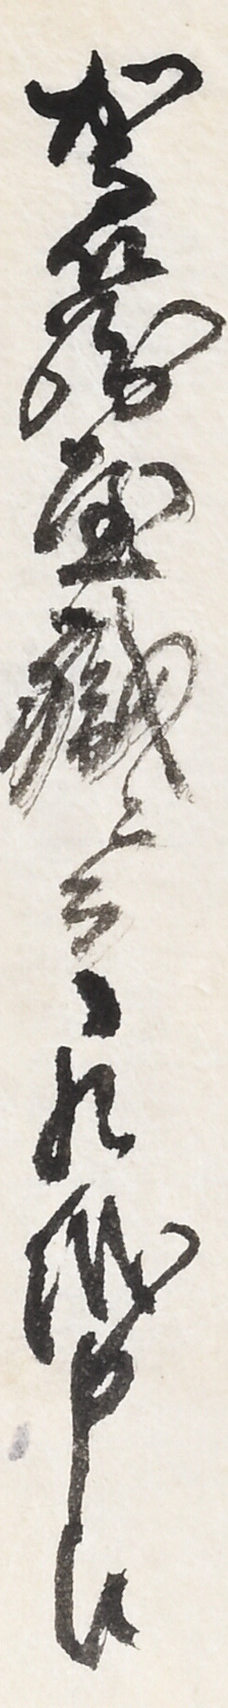駕籠屋職ニ而罷越申候
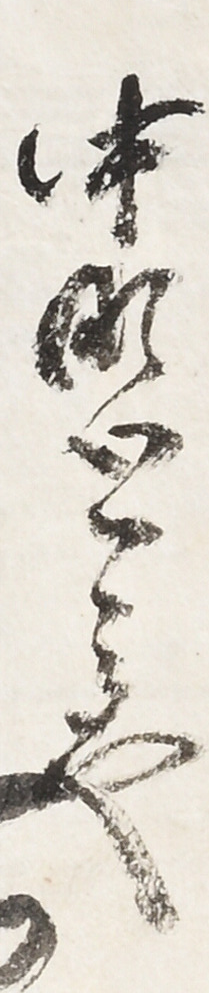中町とみや
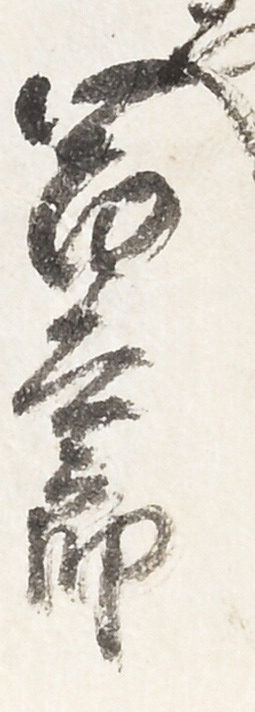冨太郎
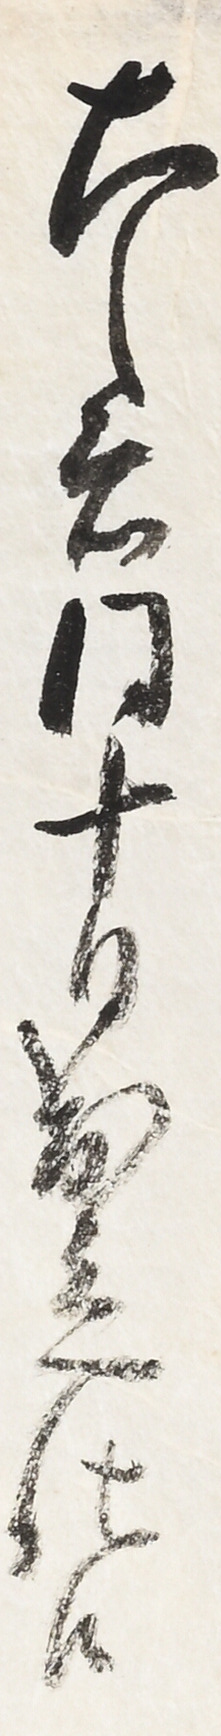右之者同十日出立仕候
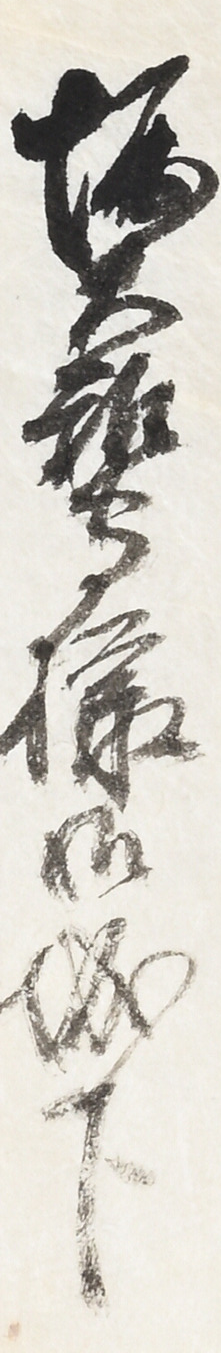堀大和守様御城下
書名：旅人泊控帳
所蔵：伊那市立高遠町図書館・合同会社AMANE
